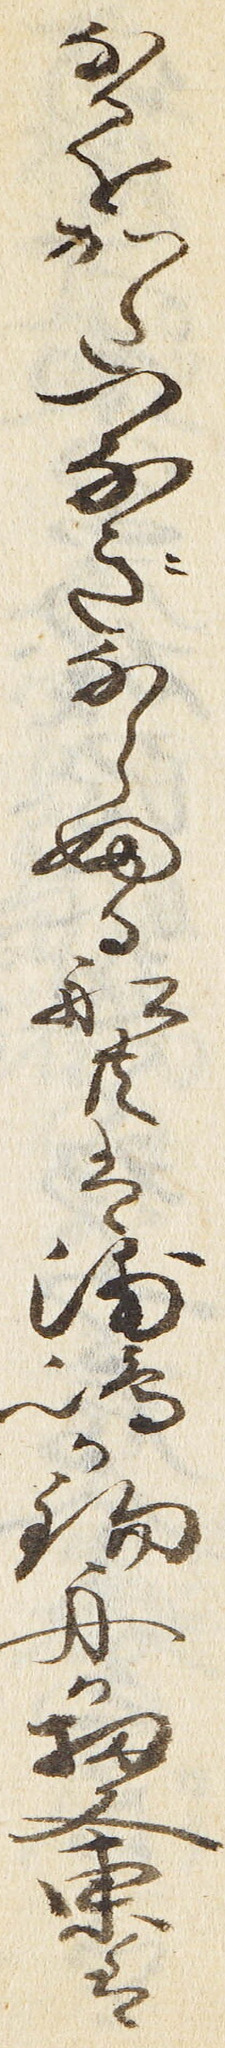なるをかたつなぎならふる船共は浦嶋か釣舟か扨又東は
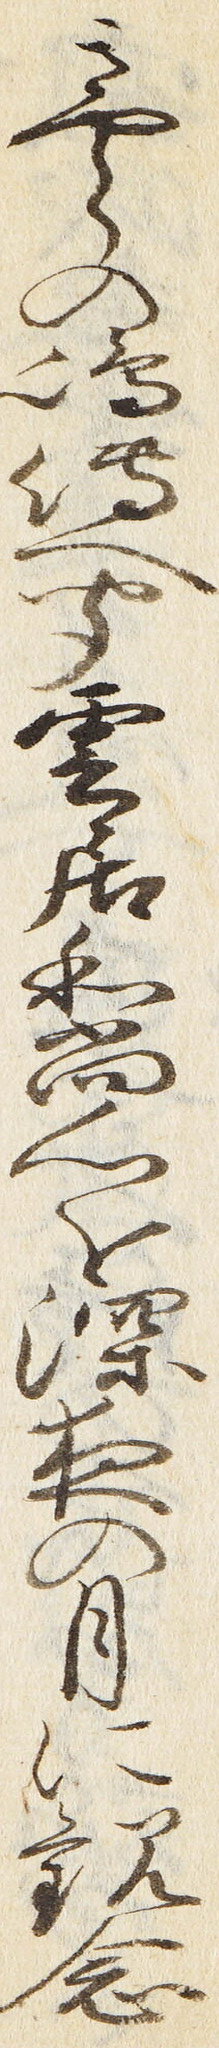きやらの嶋伝へ聞雲居和尚心を深夜の月に観念
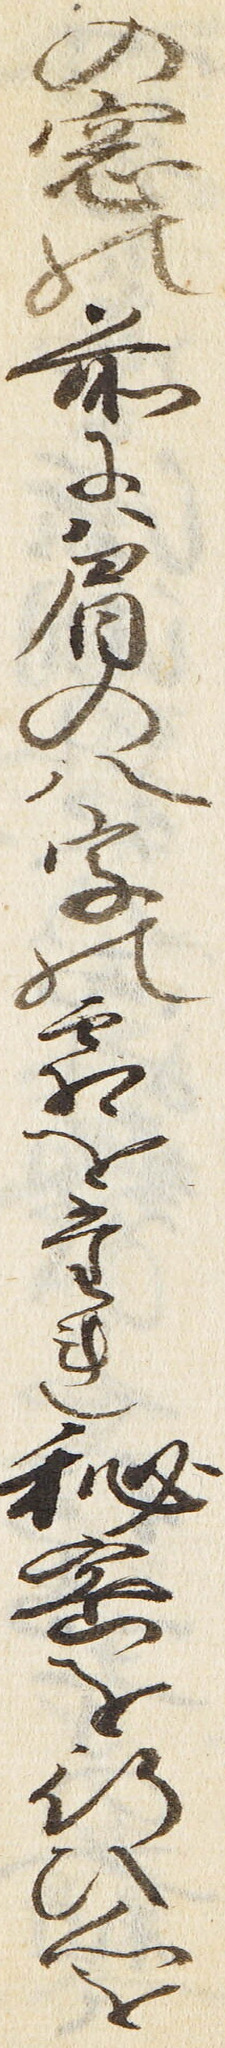の窓の前には眉の八字の霜をたれを秘密を行ひ心を
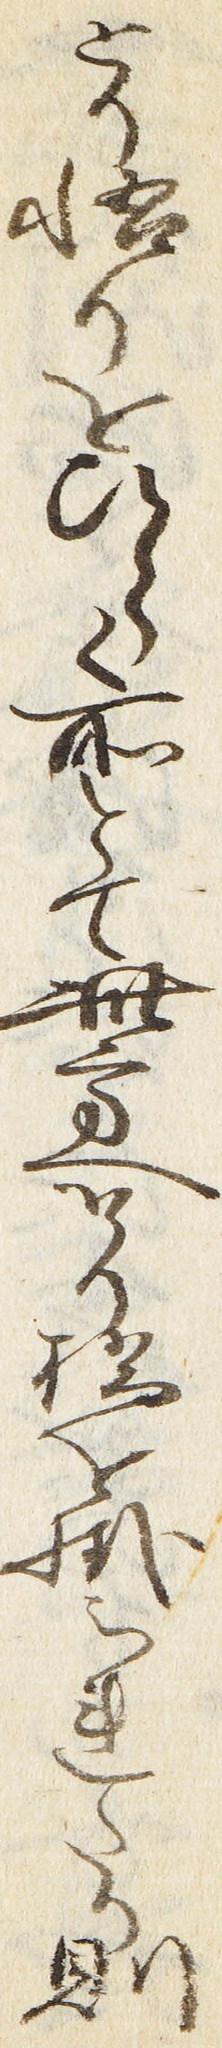とり悟りをひらく所とて此方へそり橋を掛られたり則
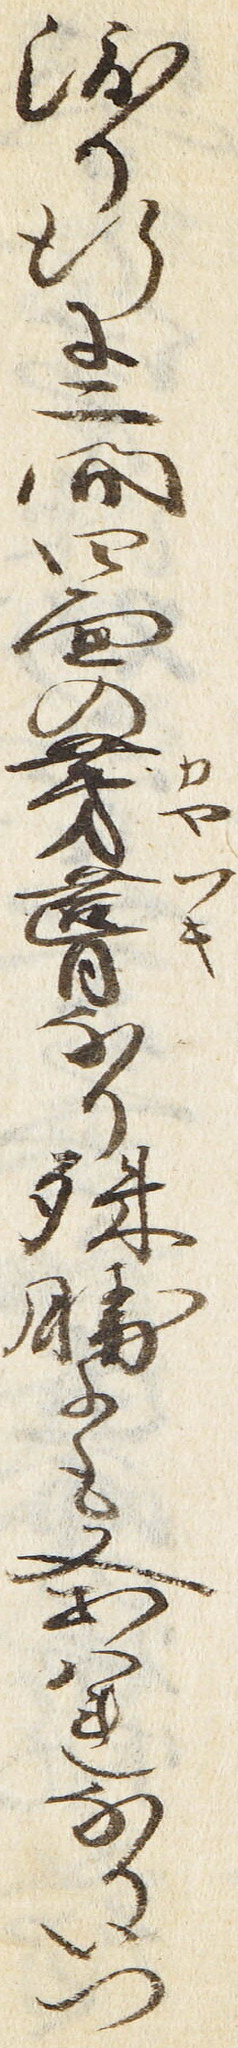渡り行に二間四面の茅葺なり殊勝にも又あはれなりいつ
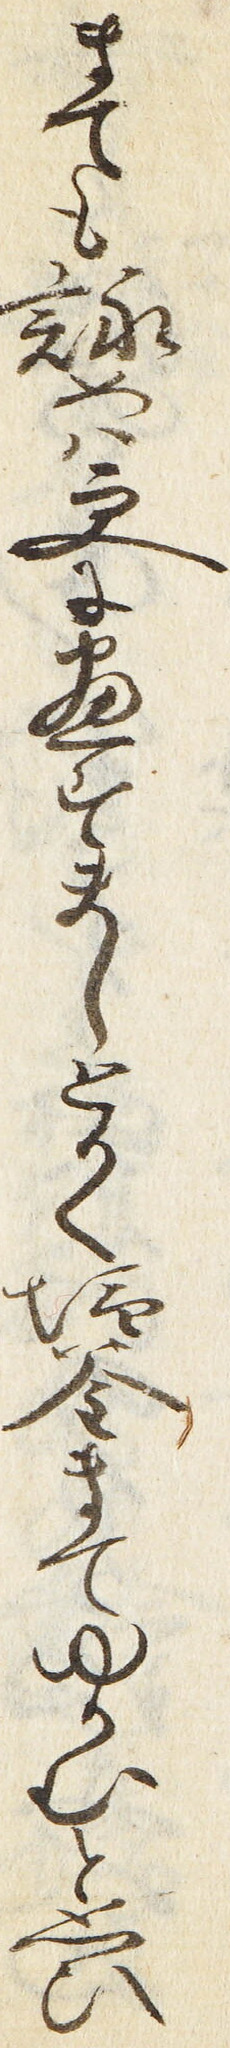まても詠めは更に尽すましとかく塩釜まてゆかむと思ひ
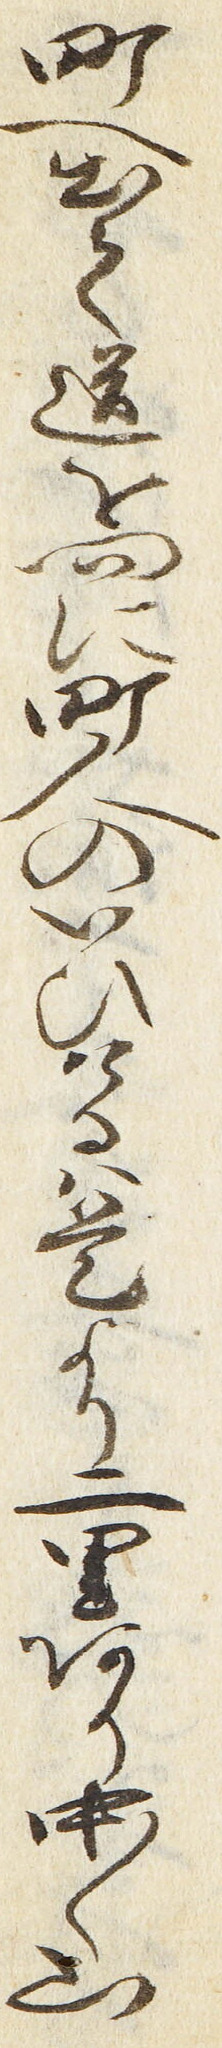町へ出て道を問に町人のいひけるは是より二里あり中〳〵山
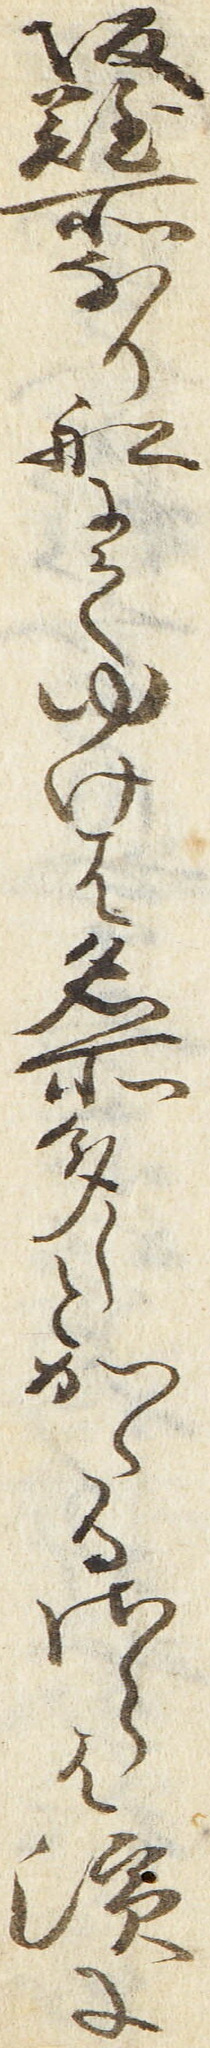坂難所なり船にてゆけは名所多しとかたるさらは浜に

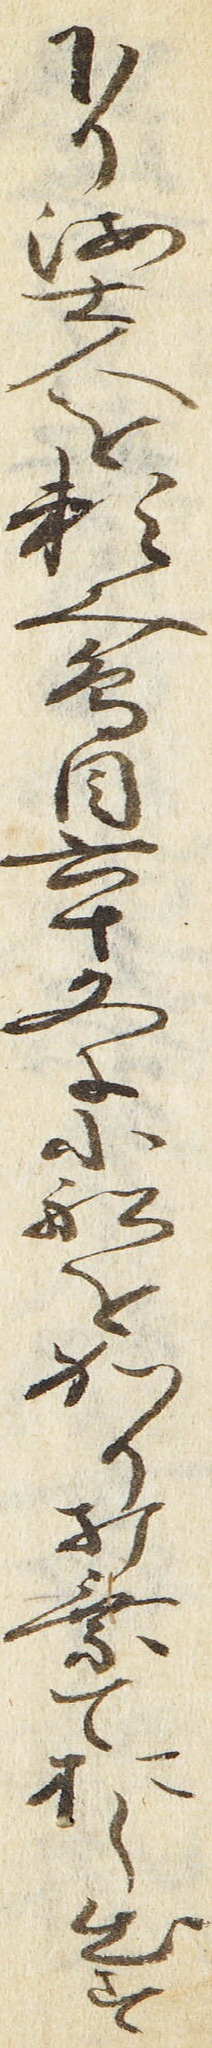下り海士人を頼み鳥目六十文に小船をかり打乗ておし出す
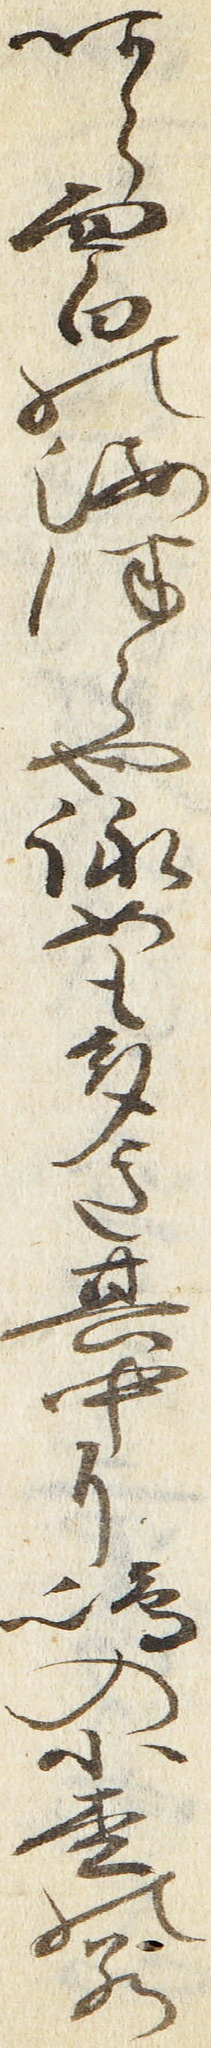ああ面白の海つらや詠めも多き其中に嶋の小松の若
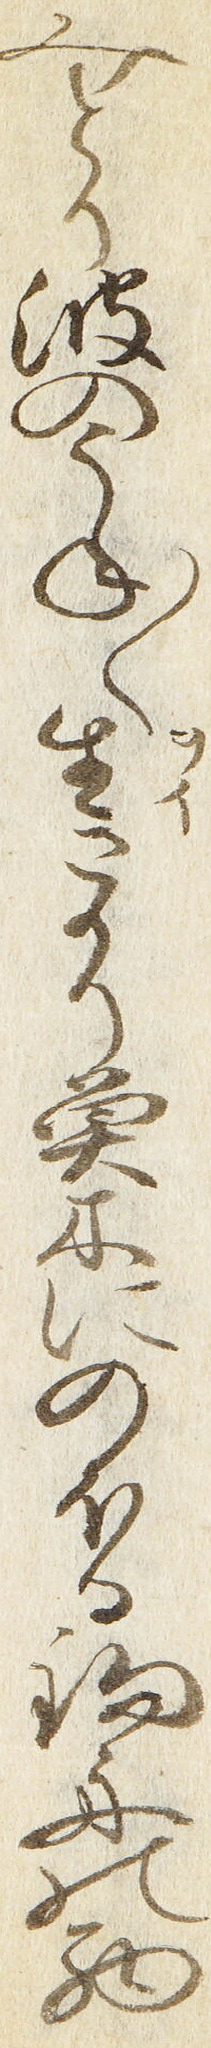みとり波のうね〳〵生さかり魚木にのほる釣舟の西
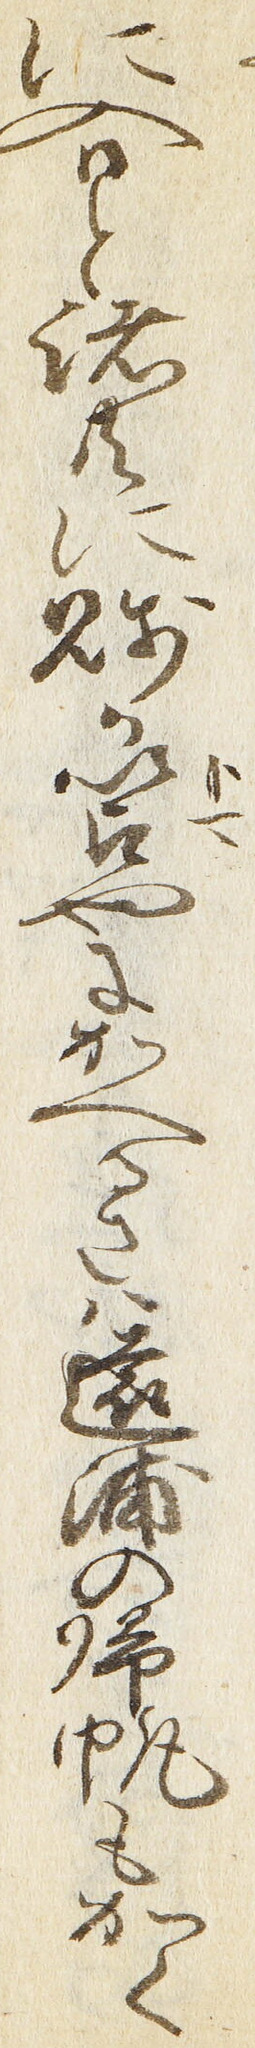に入日と諸共に賎か苫やにかへるさは遠浦の帰帆もかく
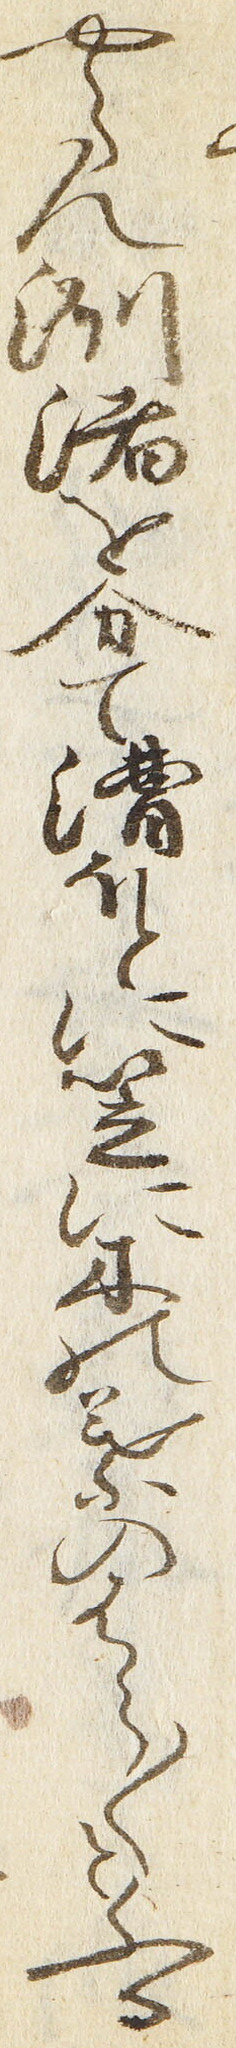やらん洲渚を分て漕ほとに笠に木の葉のはら〳〵とふる
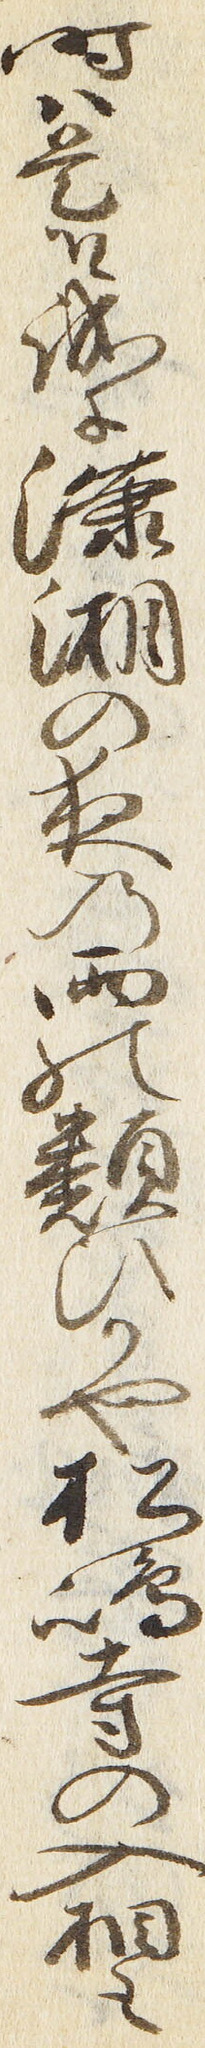時は是そ誠に瀟湘の夜の雨の類ひかや松嶋寺の入相も
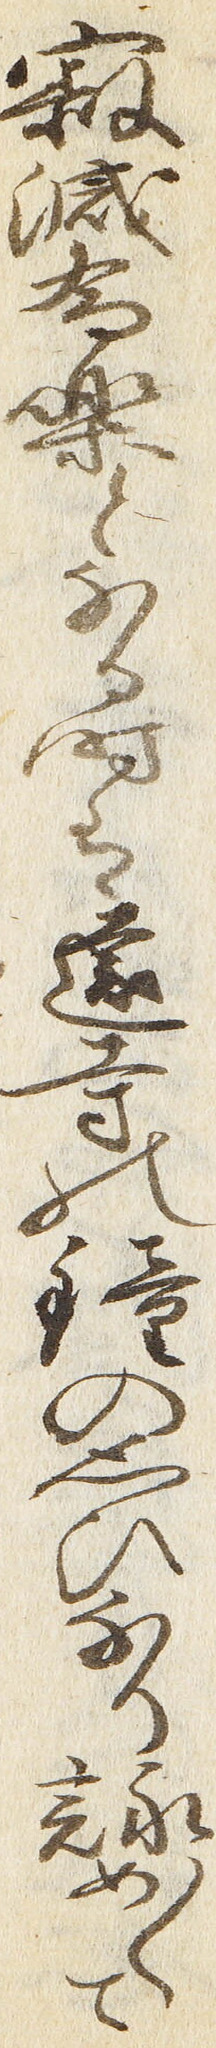寂滅為楽となる時は遠寺の鐘の思ひなり詠め〳〵と
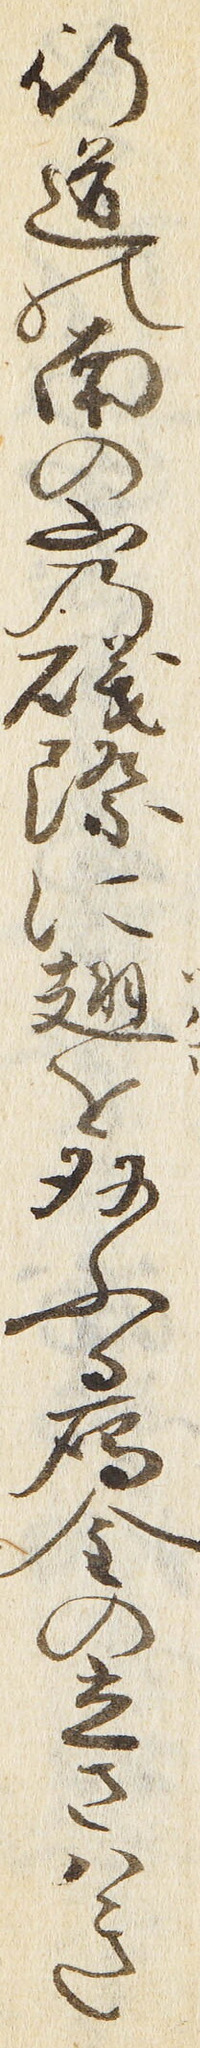行道の南の山の磯際に翅を双ふる鳫金の立さはき
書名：海陸世話日記
